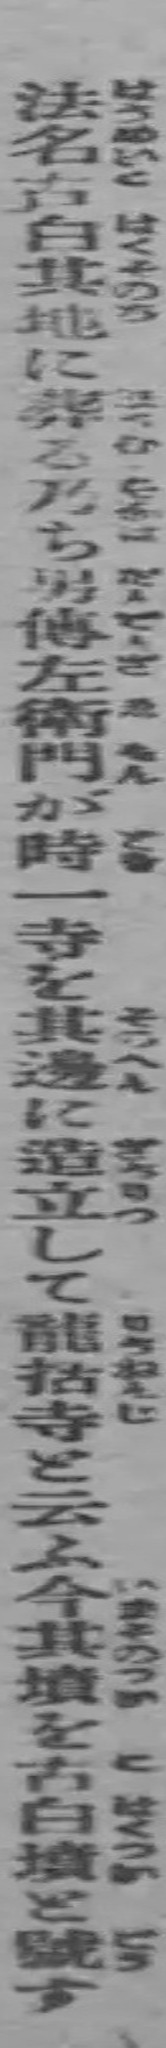法名古白其地に葬る乃ち男伝左衛門が時一寺を其辺に造立して龍拈寺と云ふ今其墳を古白墳と号す
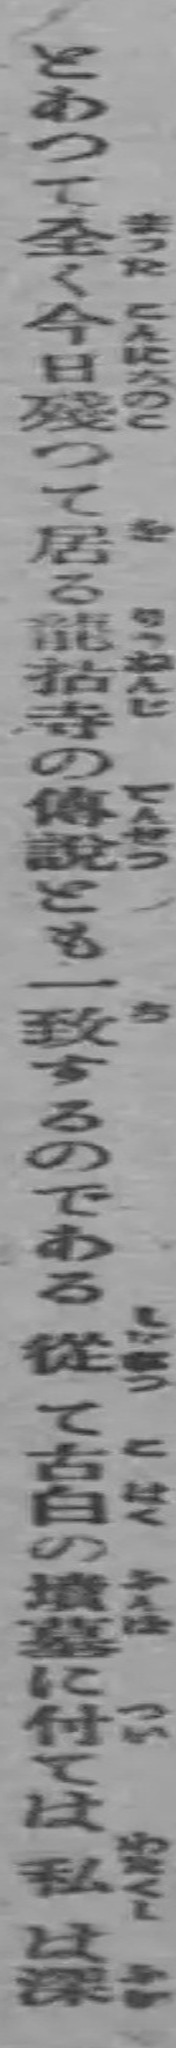とあつて全く今日残つて居る龍拈寺の伝説とも一致するのである従て古白の墳墓に付ては私は深
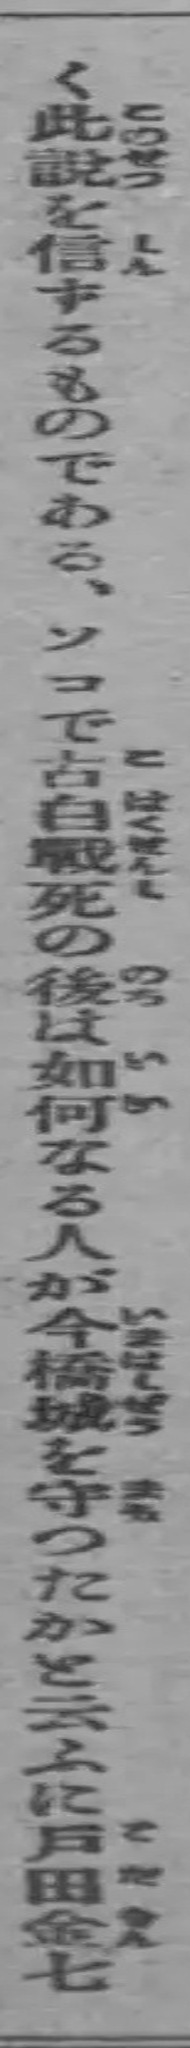戸田金七郎く此説を信ずるものである、ソコデ古白戦死の後は如何なる人が今橋城を守つたかと云ふに戸田金七
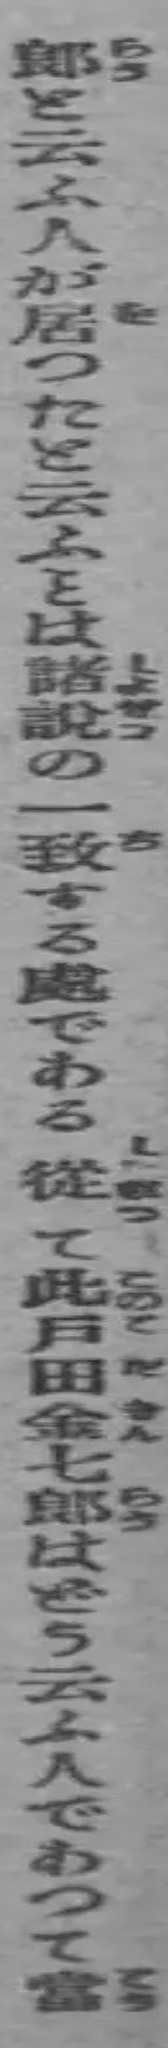郎と云ふ人が居つたと云ふことは諸説の一致する処である従て此戸田金七郎はどう云ふ人であつて当
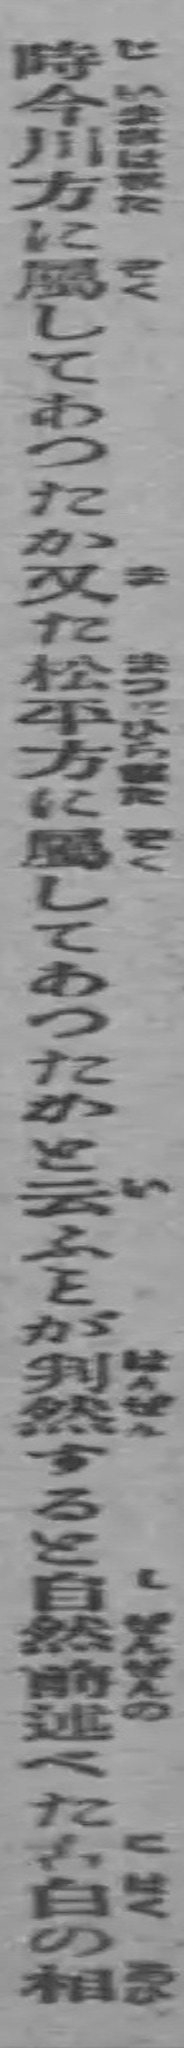時今川方に属してあつたか又た松平方に属してあつたかと云ふことが判然すると自然前述べた古白の相
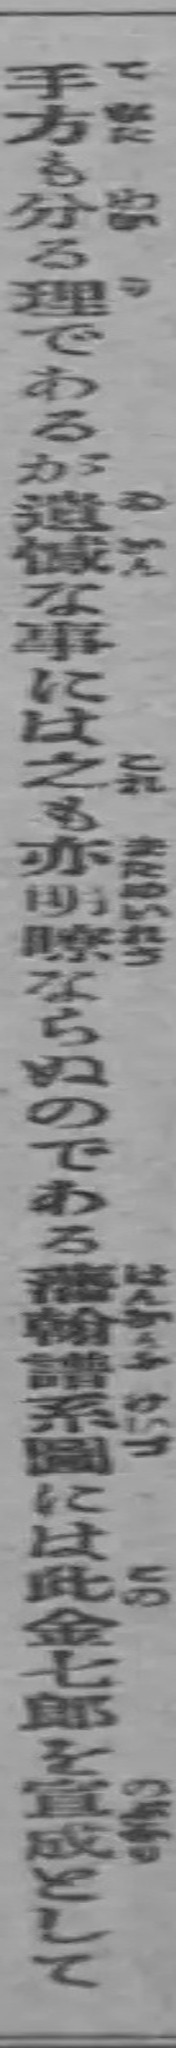手方も分る理であるが遺憾な事には之も亦明瞭ならぬのである藩翰譜系図には此金七郎を宣成として
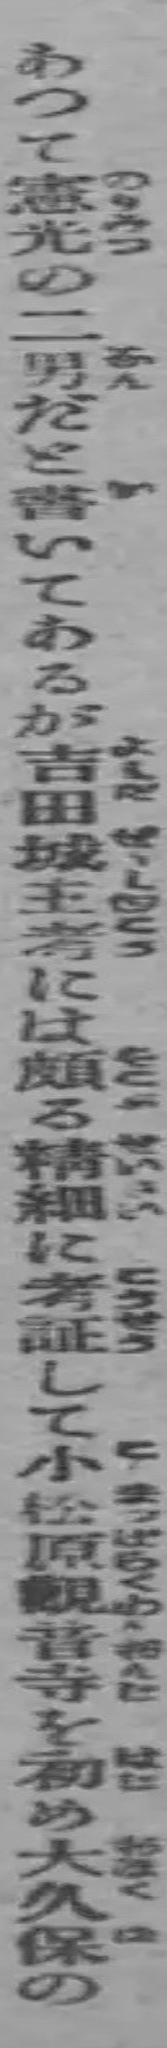あつて憲光の二男だと書いてあるが吉田城主考には頗る精細に考証して小松原観音寺を初め大久保の
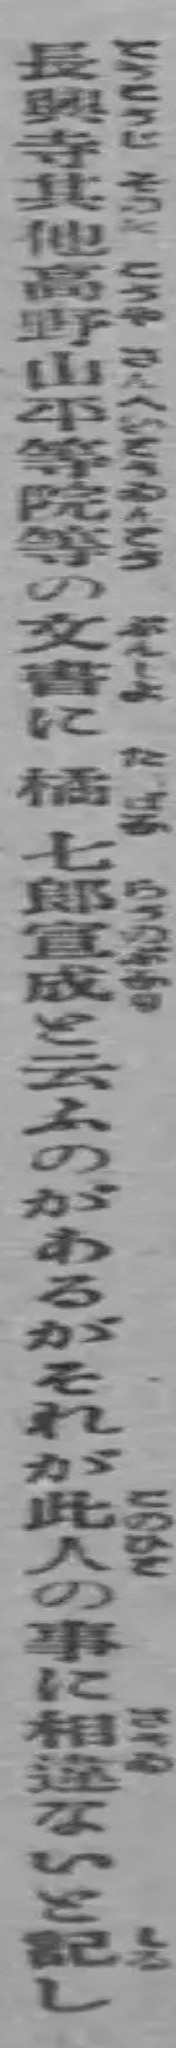長興寺其他高野山平等院等の文書に橘七郎宣成と云ふのがあるがそれが此人の事に相違ないと記し
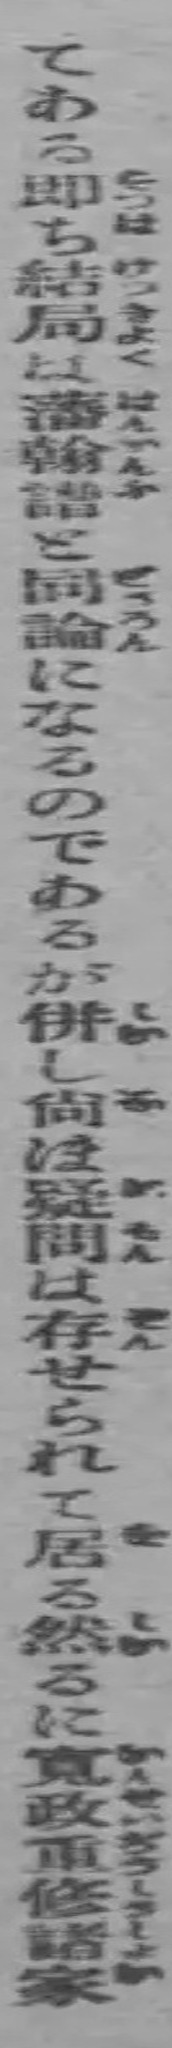てある即ち結局は藩翰譜と仝論になるのであるが併し尚ほ疑問は存せられて居る然るに寛政重修諸家
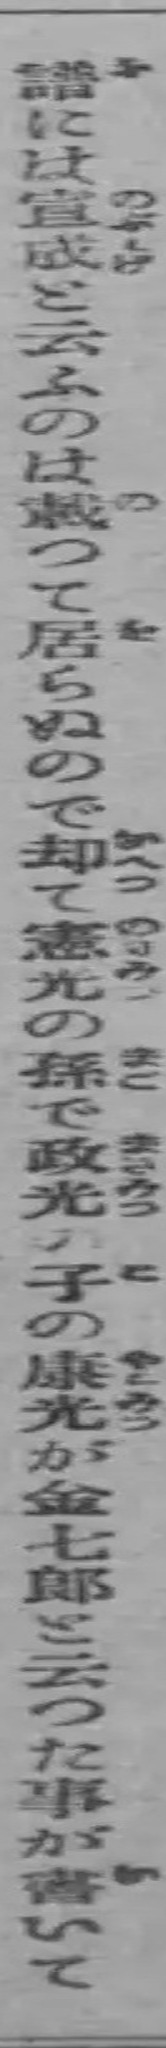譜には宣成と云ふのは載つて居らぬので却て憲光の孫で政光の子の康光が金七郎と云つた事が書いて
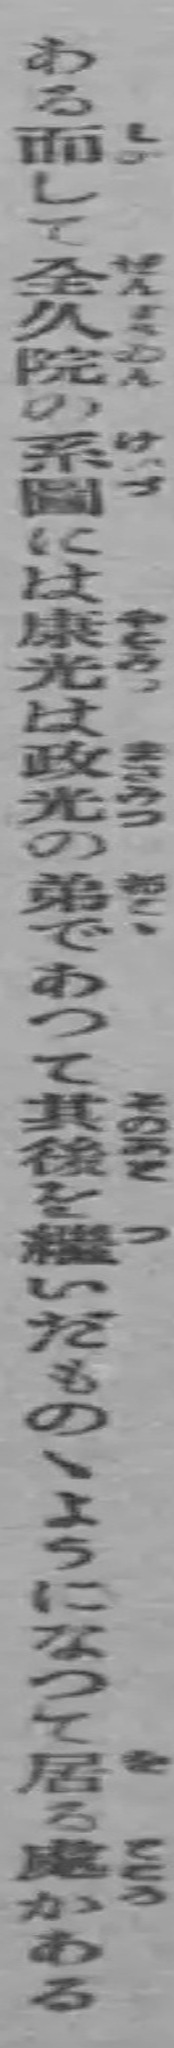ある而して全久院の系図には康光は政光の弟であつて其後を継いだものゝようになつて居る処かある
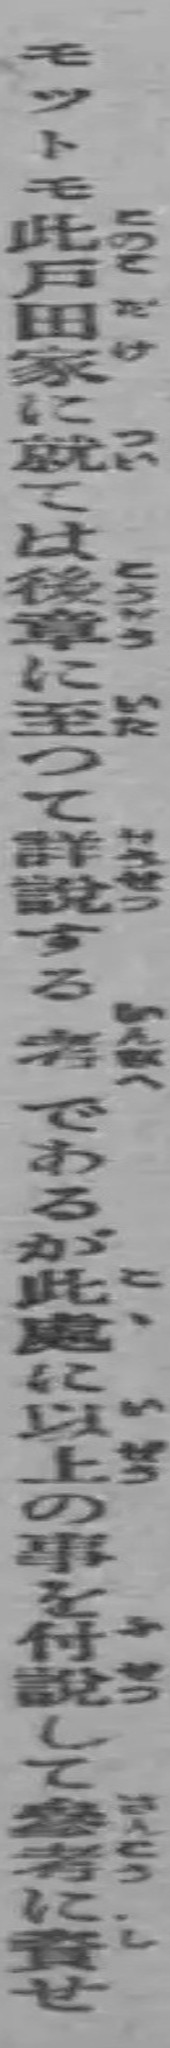モツトモ此戸田家に就ては後章に至つて詳説する考であるが此処に以上の事を付説して参考に資せ
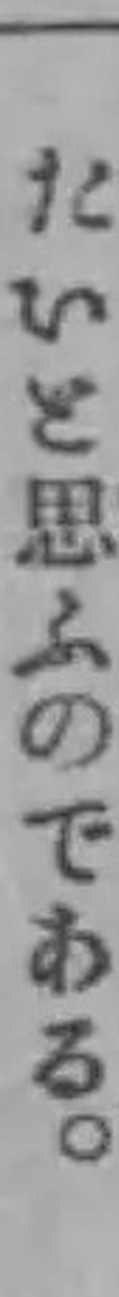たいと思ふのである。
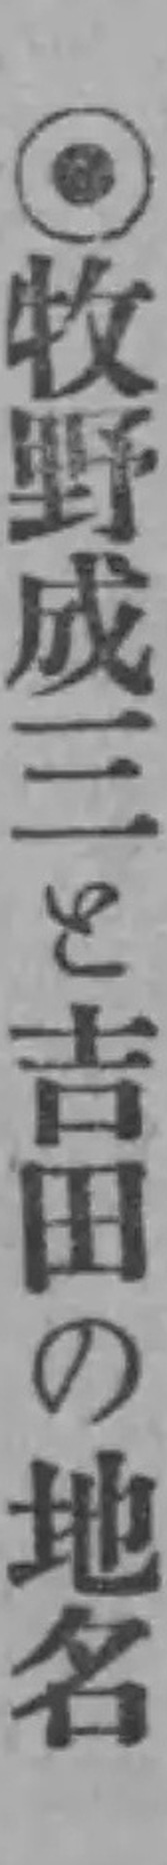⦿牧野成三と吉田の地名
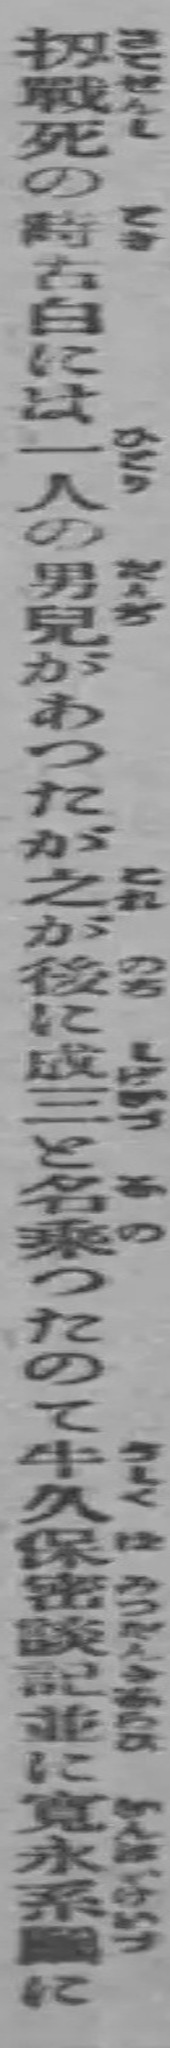扨戦死の時古白には一人の男児があつたが之が後に成三と名乗つたのて牛久保密談記並に寛永系図に
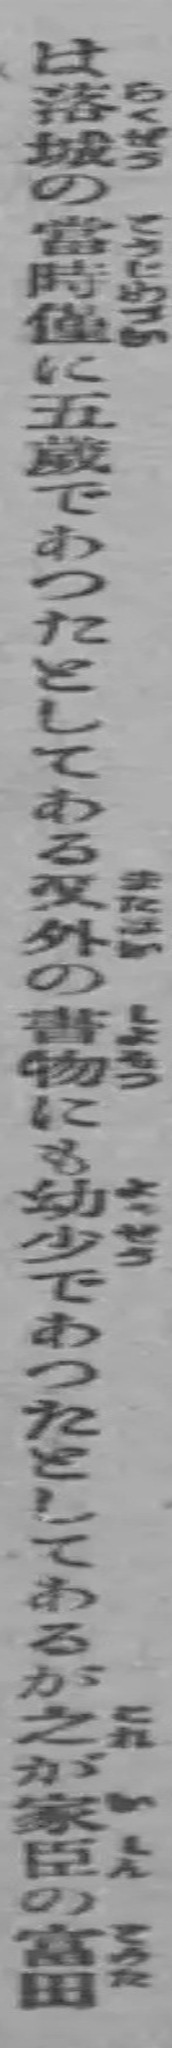は落城の当時僅に五歳であつたとしてある又外の書物にも幼少であつたとしてあるが之が家臣の富田
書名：豊橋市史談
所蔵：国立国会図書館 National Diet Library, JAPAN
